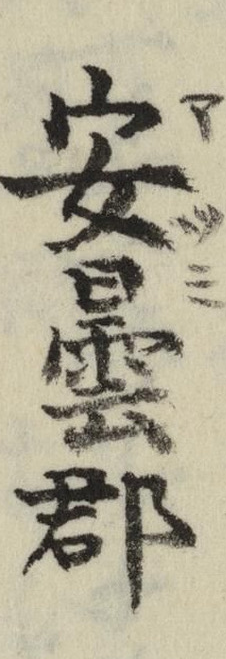安曇郡
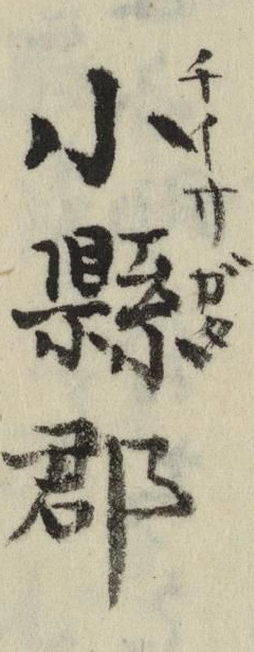小県郡
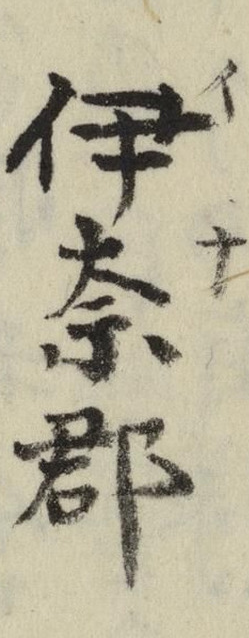伊奈郡
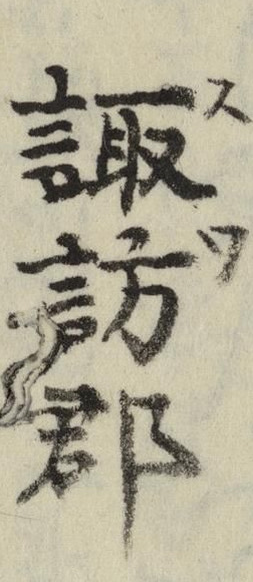諏訪郡
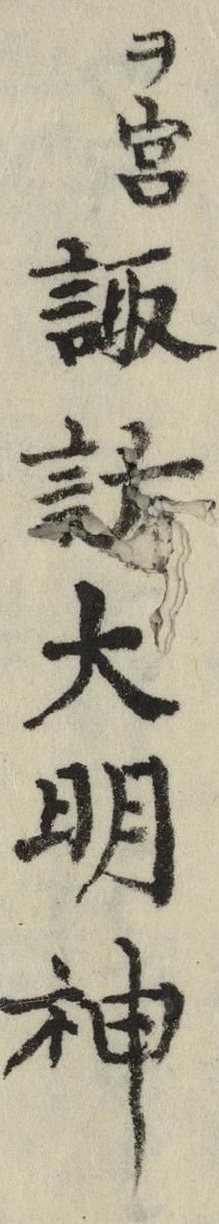ヲ宮諏訪大明神

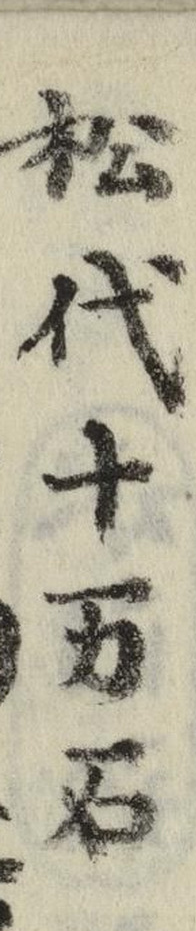松代十万石
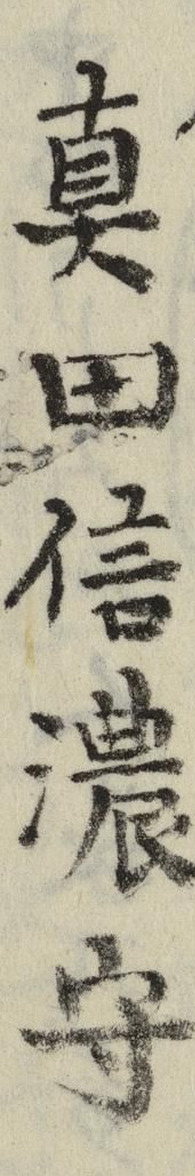真田信濃守
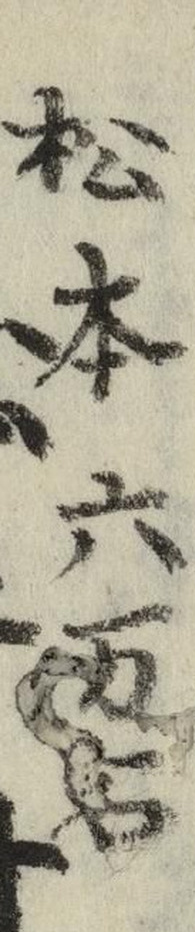松本六万石
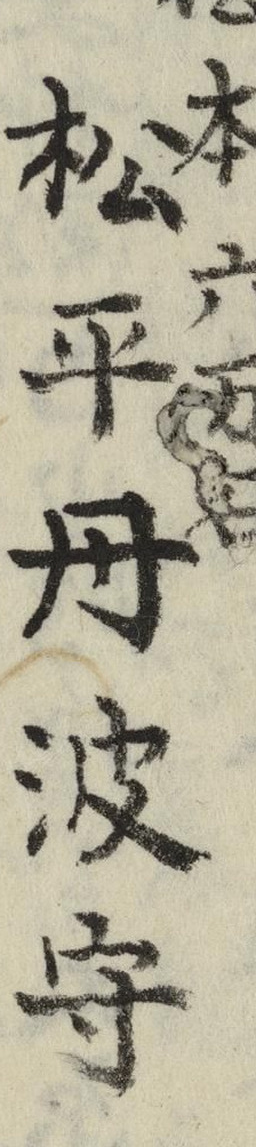松平丹波守
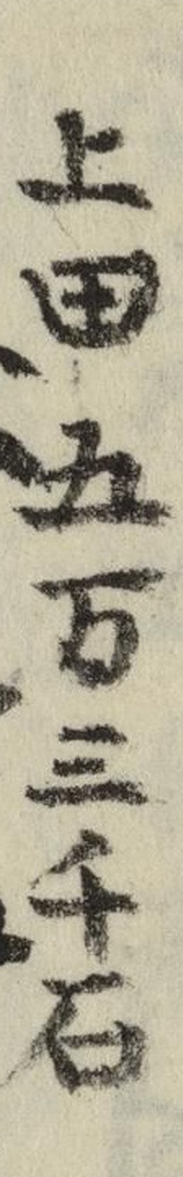上田五万三千石
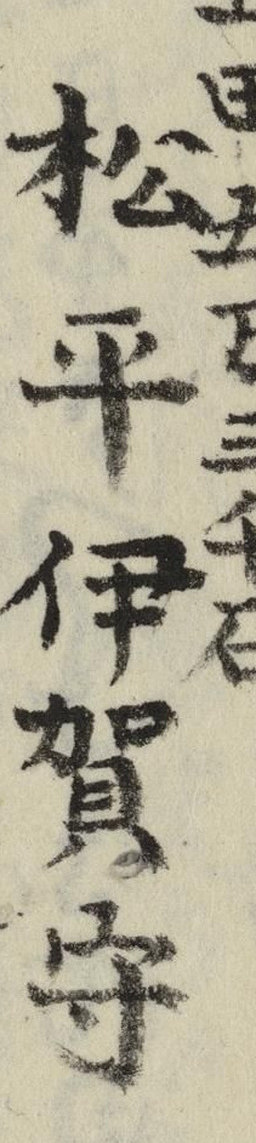松平伊賀守
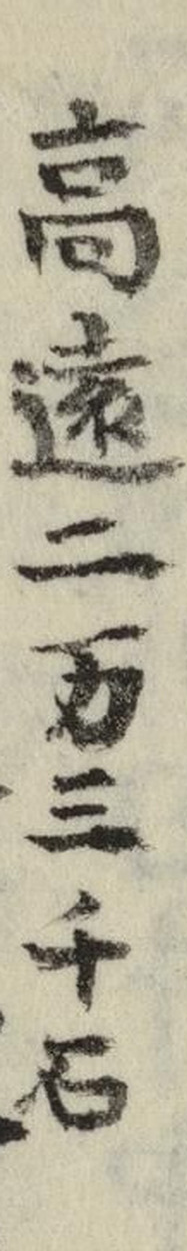高遠二万三千石
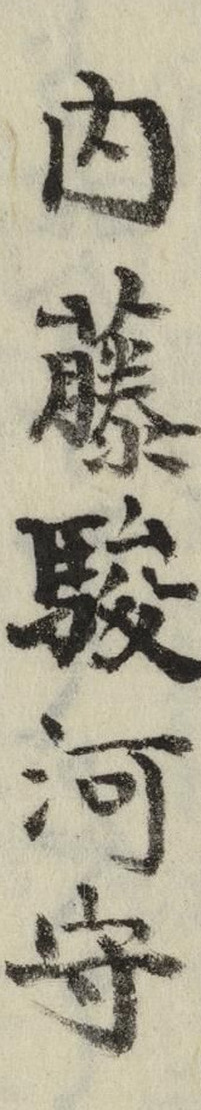内藤駿河守
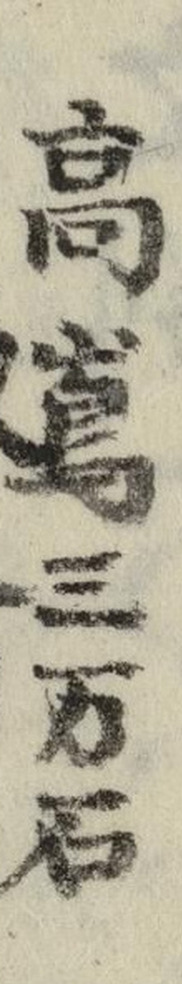高嶋三万石
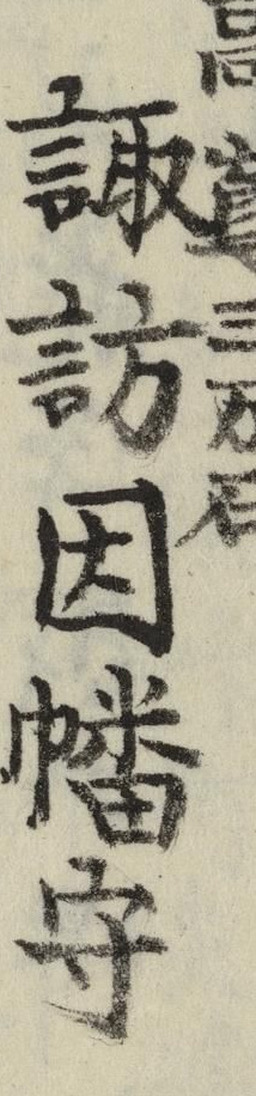諏訪因幡守
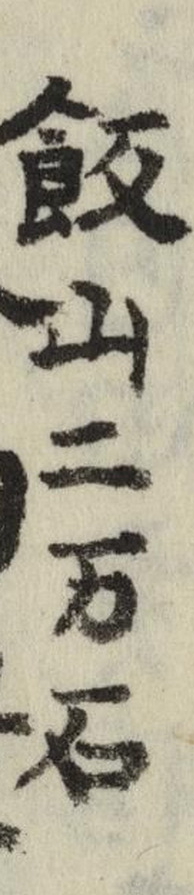飯山二万石
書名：信州大地震一件之冩　丁未弘化四年三月吉日
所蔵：東京大学地震研究所図書室 Earthquake Research Institute Library, The University of Tokyo, JAPAN
